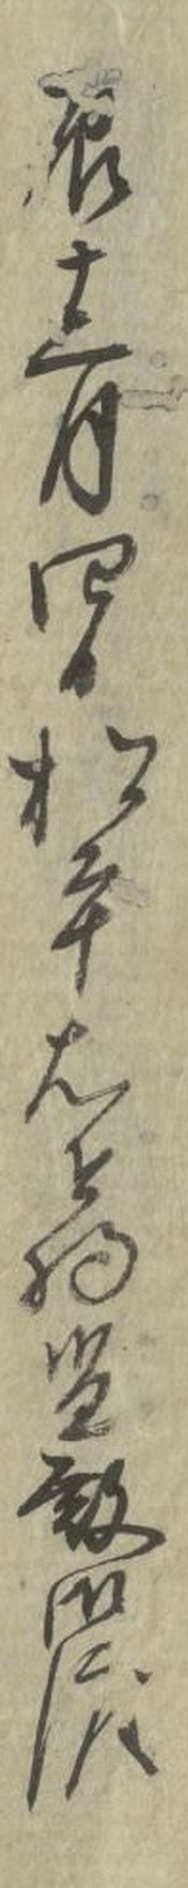辰十二月四日松平右近将監殿御渡
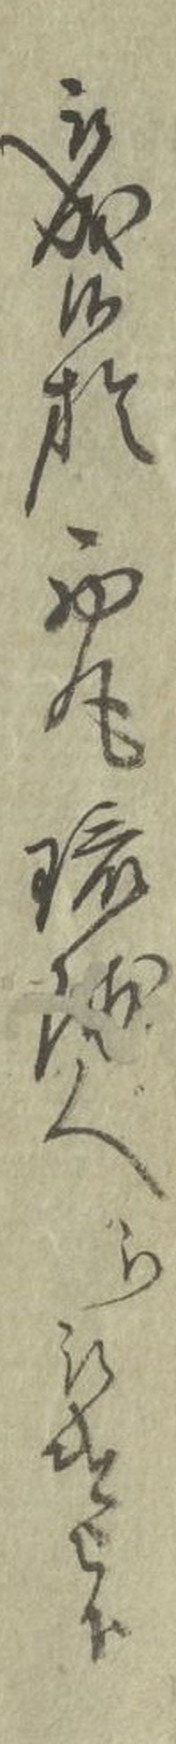被成候於西丸琉球人え被遣被下
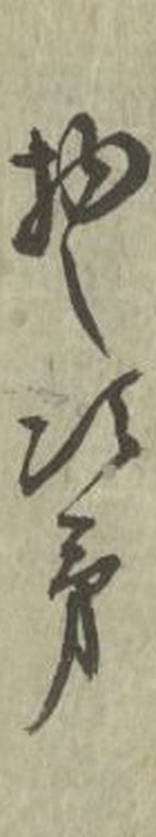物之次第
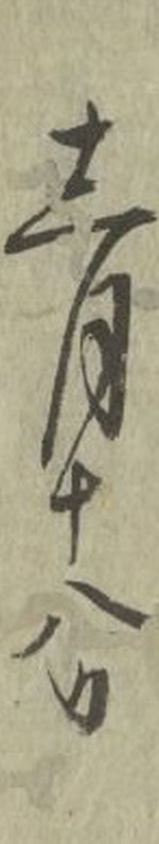十二月十八日

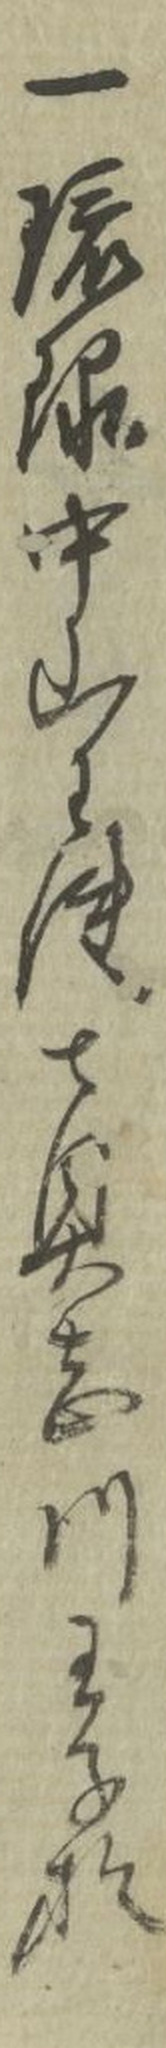一琉球中山王使者具志川王子於
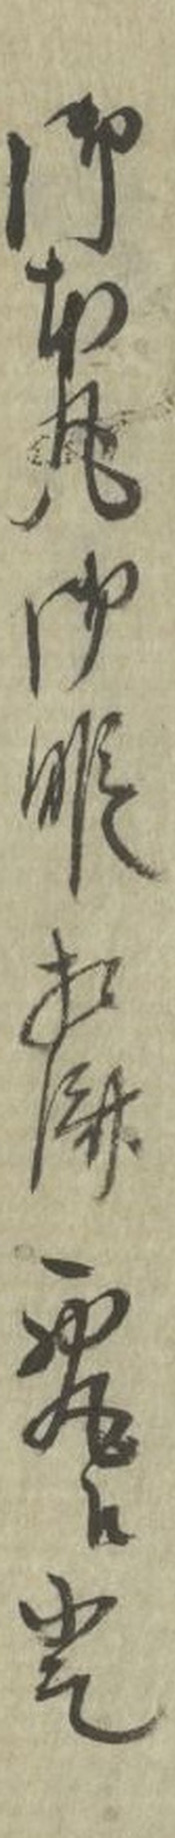御本丸御暇相済西丸え登
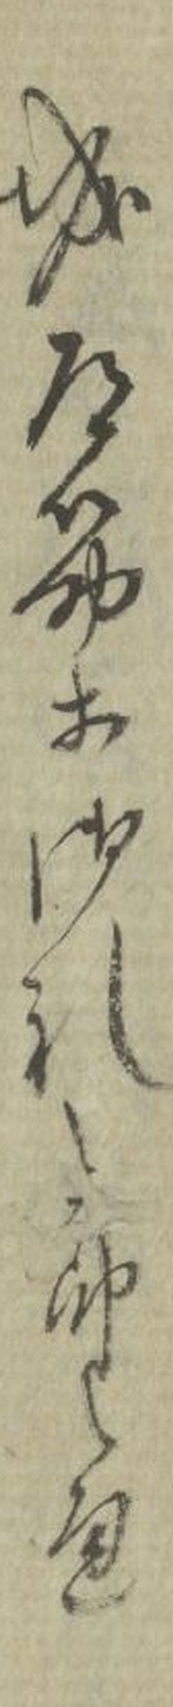城道筋等御礼之節之通
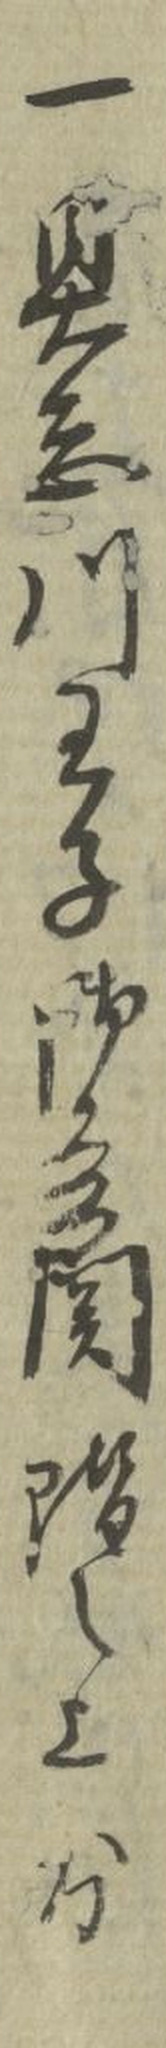一具志川王子御玄関階之上至
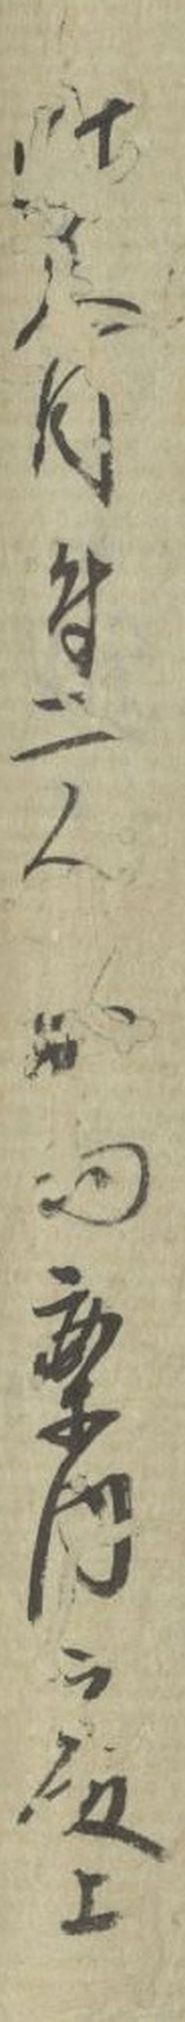時大目付二人出向案内而殿上
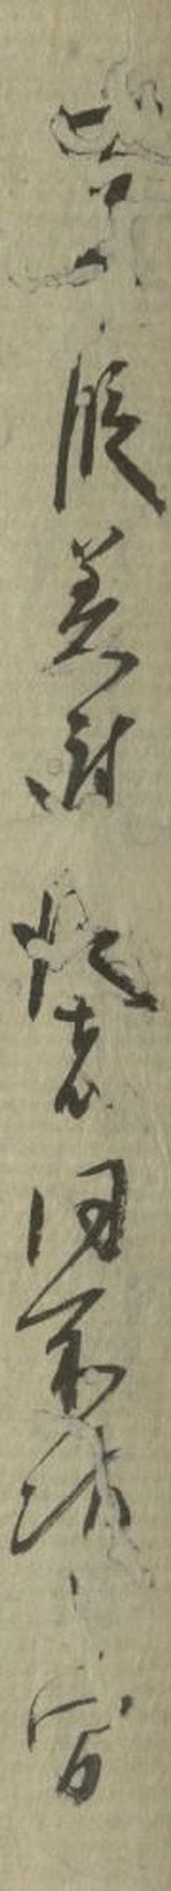間下段着座従者同所次之間
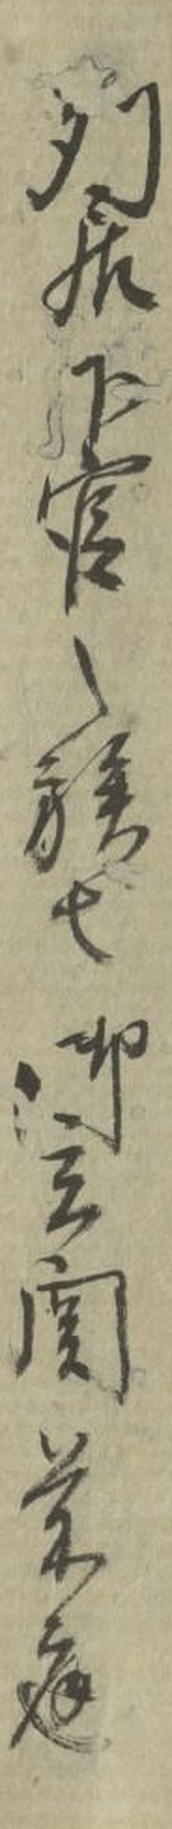列居下官之族は御玄関庭
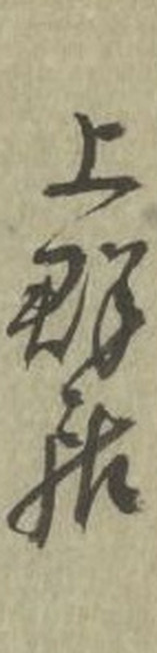上群居
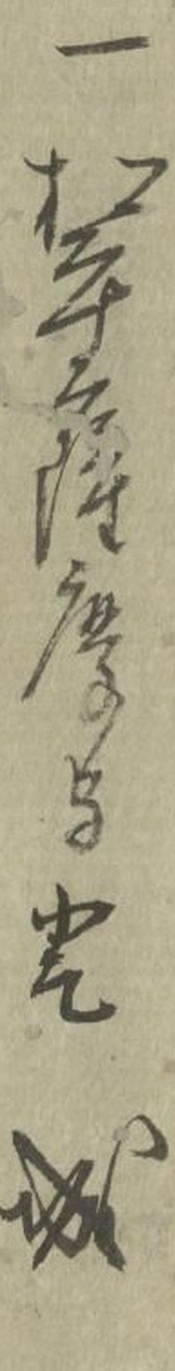一松平薩摩守登城
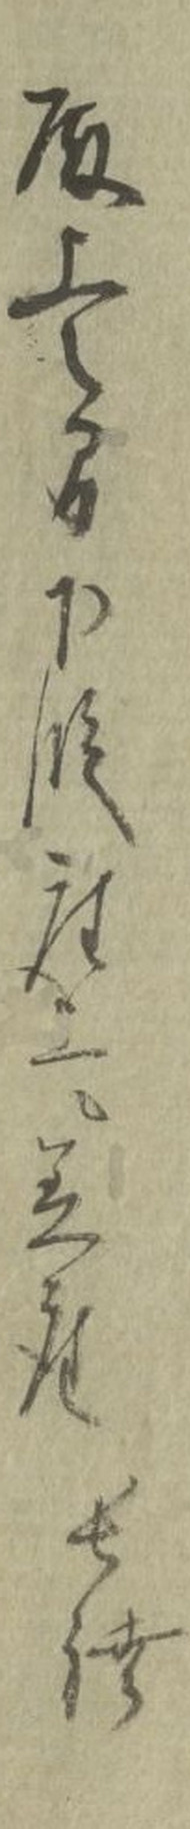殿上之間下段座上に着座長袴

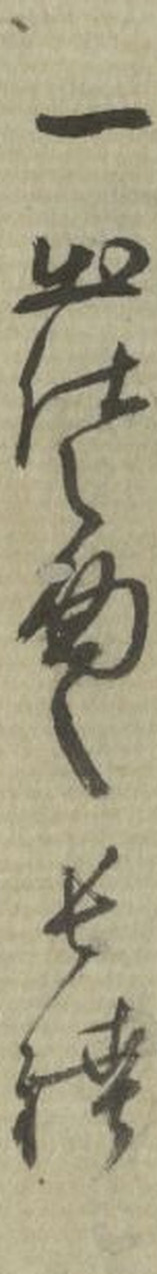一出仕之面之長袴
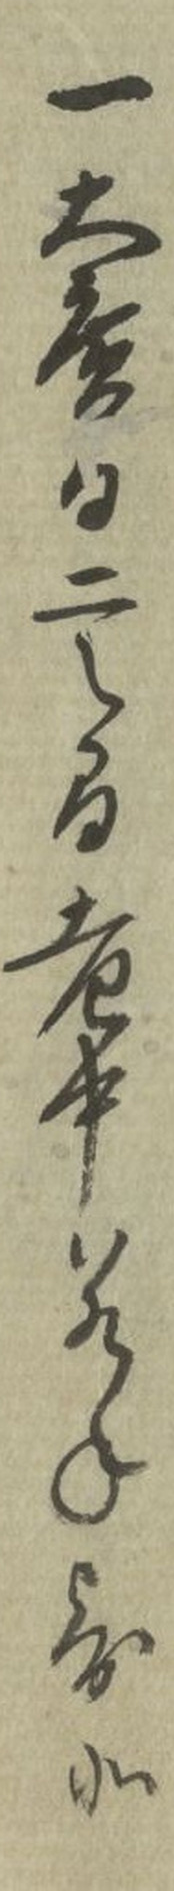一大広間二之間老中若年寄北
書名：琉球来朝記 自八至十四終
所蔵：University of the Ryukyus Library
